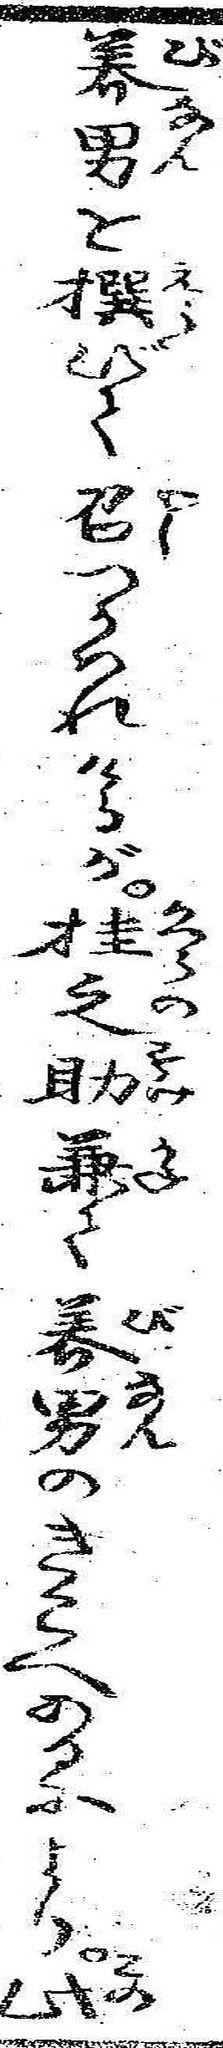美男を撰びて召つかはれけるが。桂之助兼て美男のきこへあるにより。此
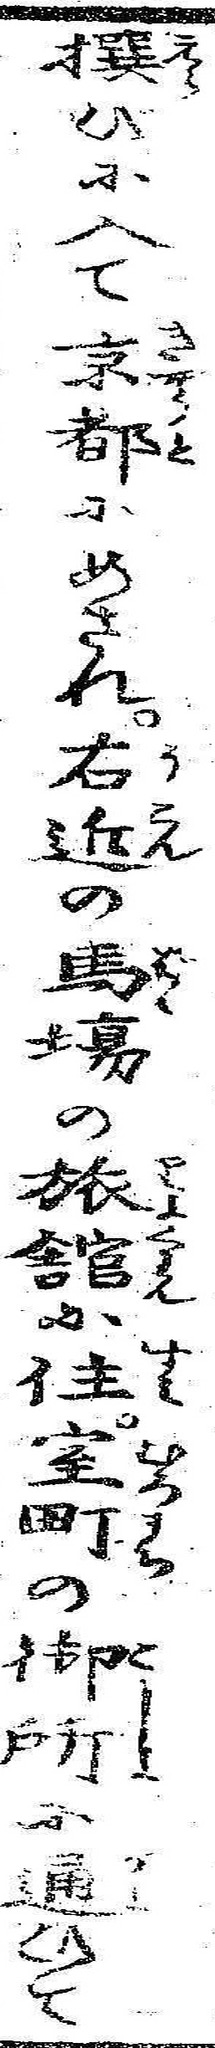撰びに入て京都にめされ。右近の馬場の旅館に住。室町の御所に通ひて
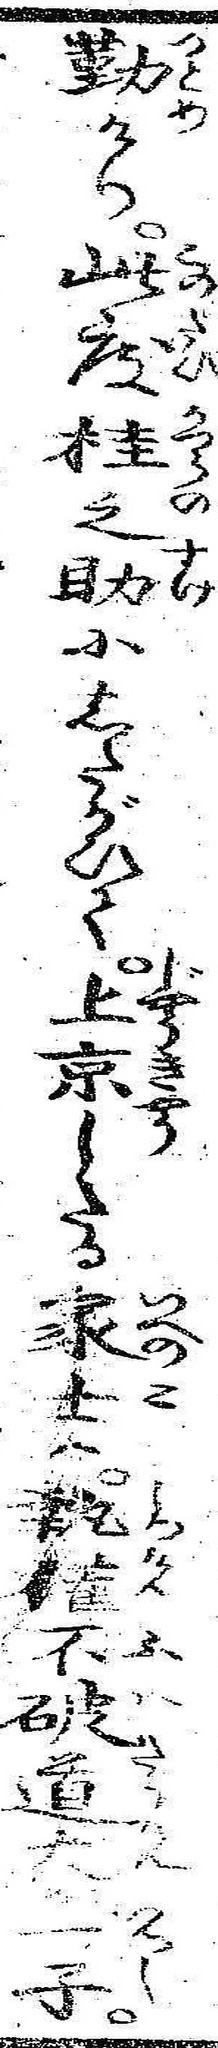勤けり。此度桂之助にしたがひて。上京したる家士は。執権不破道犬一子。
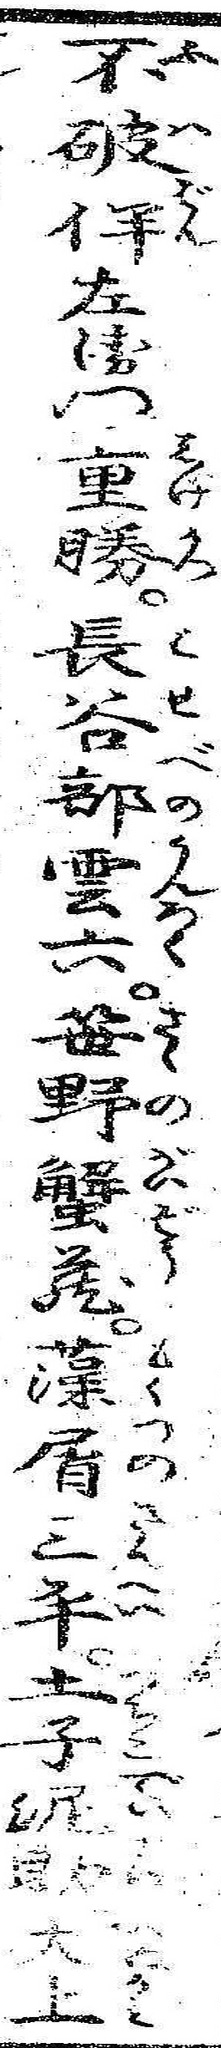不破伴左衛門重勝。長谷部雲六。笹野蟹蔵。藻屑三平。土子泥助。犬上
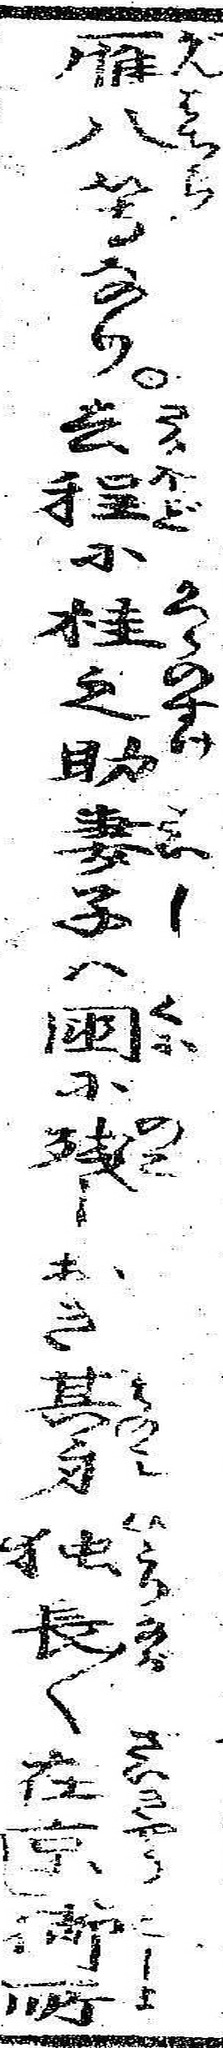雁八等なり。去程に桂之助妻子は国に残しおき其身独長々在京し。御所
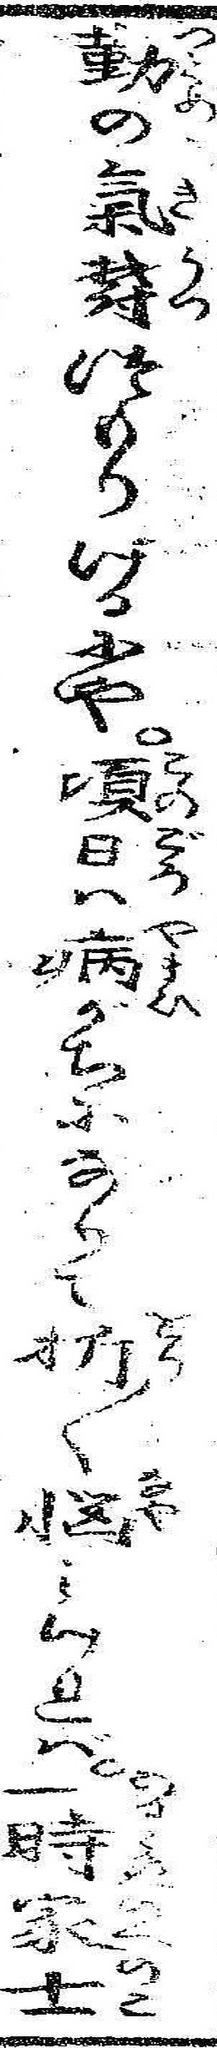勤の気欝つもりけるにや。頃日は病がちになりて折々悩みければ。一時家士
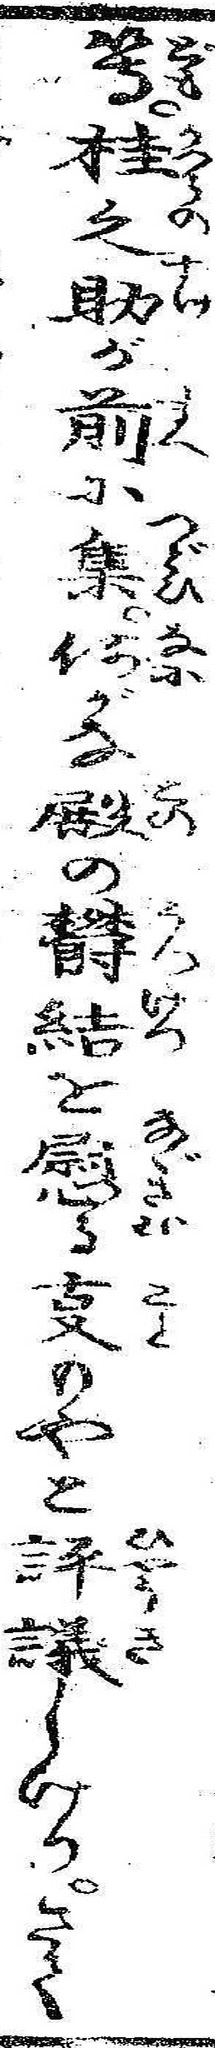等。桂之助が前に集。何がな殿の欝結を慰る事もやと評議しけり。さて
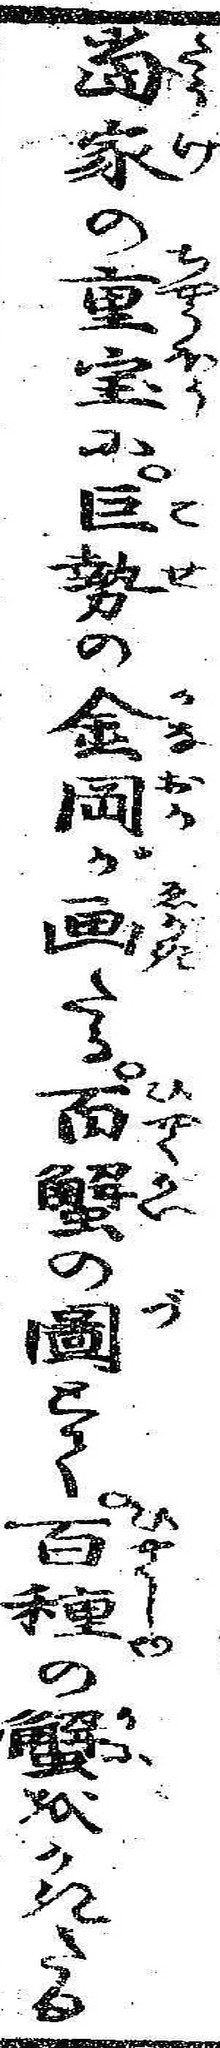当家の重宝に。巨勢の金岡が画たる。百蟹の図とて。百種の蟹をかきたる
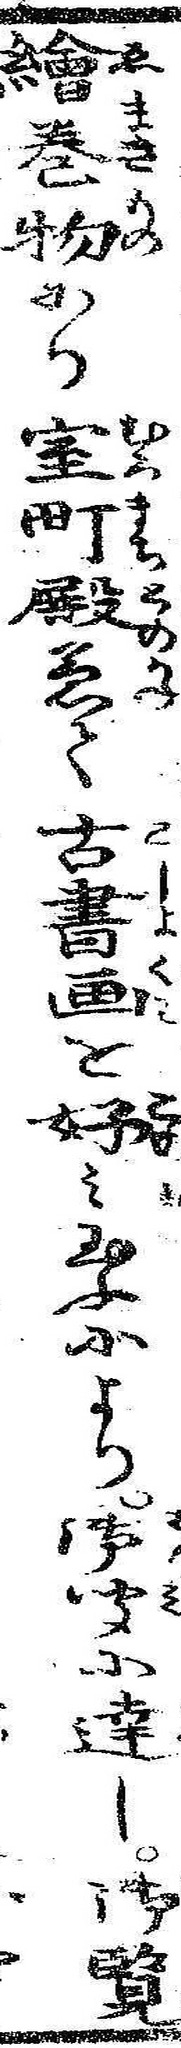絵巻物あり室町殿兼て古書画を好み玉ふにより。御聞に達し。御覧
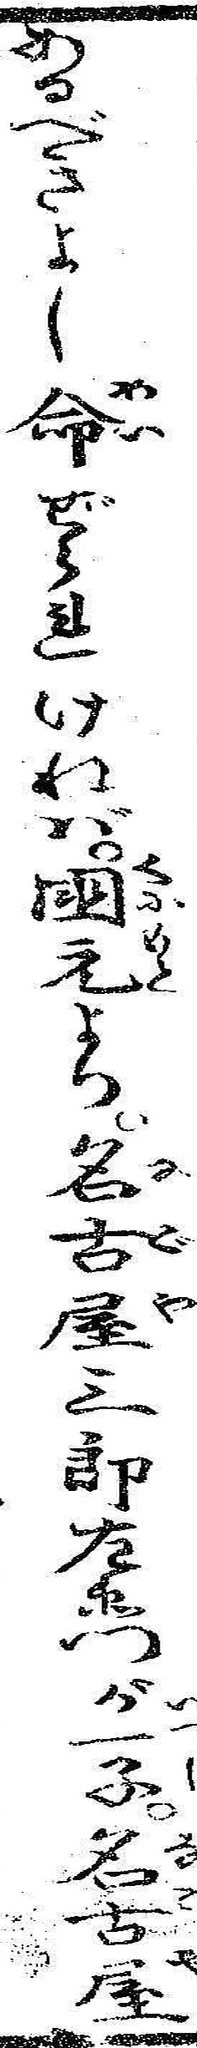あるべきよし命ぜられければ。国元より。名古屋三郎左衛門が一子。名古屋
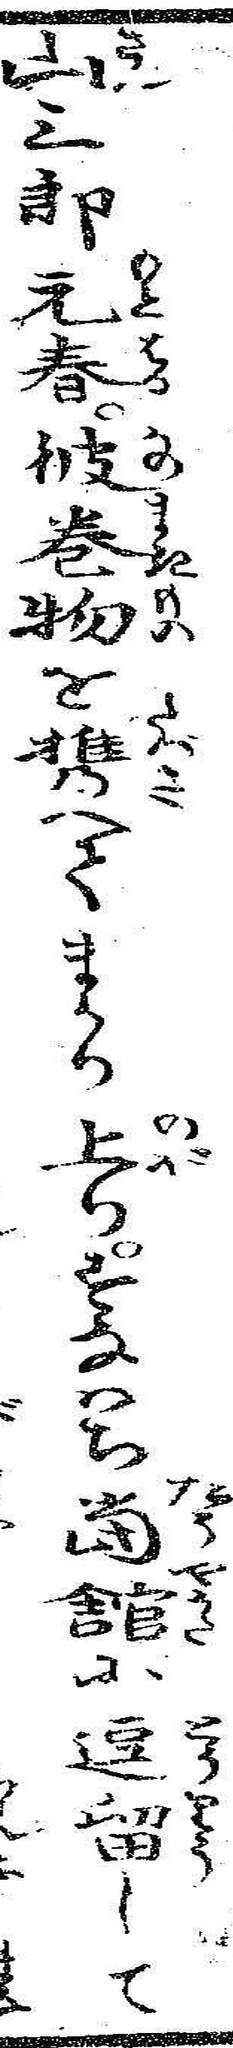山三郎元春。彼巻物を携へてまかり上り。すなはち当館に逗留して
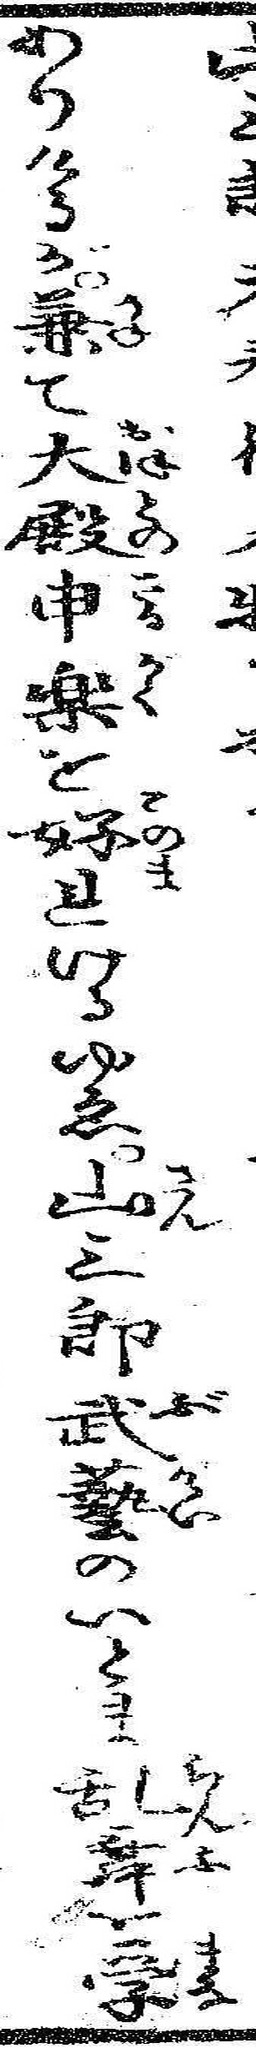ありけるが。兼て大殿申楽を好れけるゆゑ。山三郎武芸のいとま乱舞を学
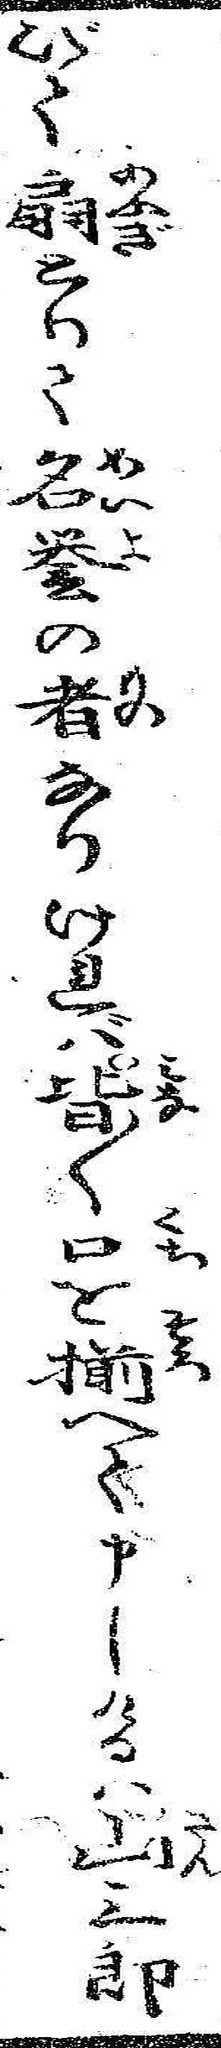びて扇とりて名誉の者なりければ。皆々口を揃へて申しけるは山三郎
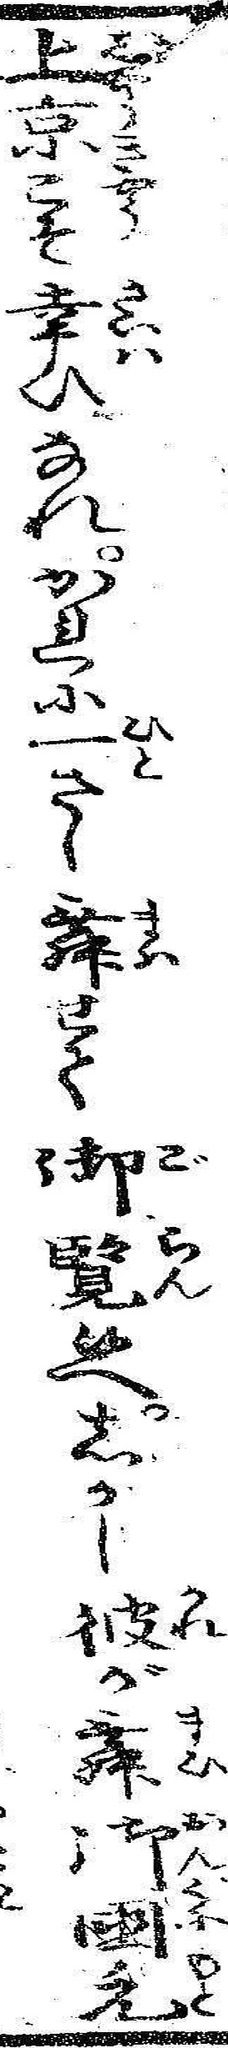上京こそ幸ひなれ。かれに一さし舞せて御覧候へ。しかし彼が舞御国元
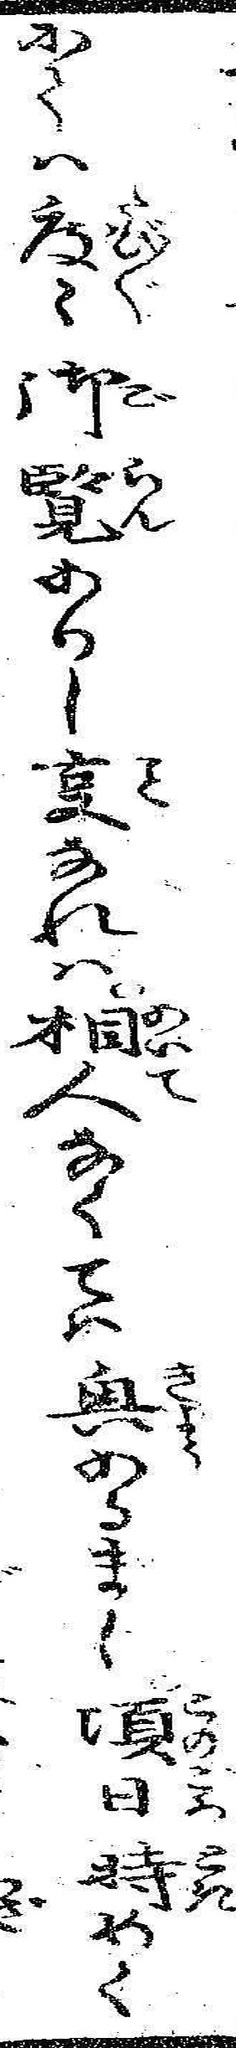にては度々御覧ありし事なれは。相人なくては興あるまし頃日時めく
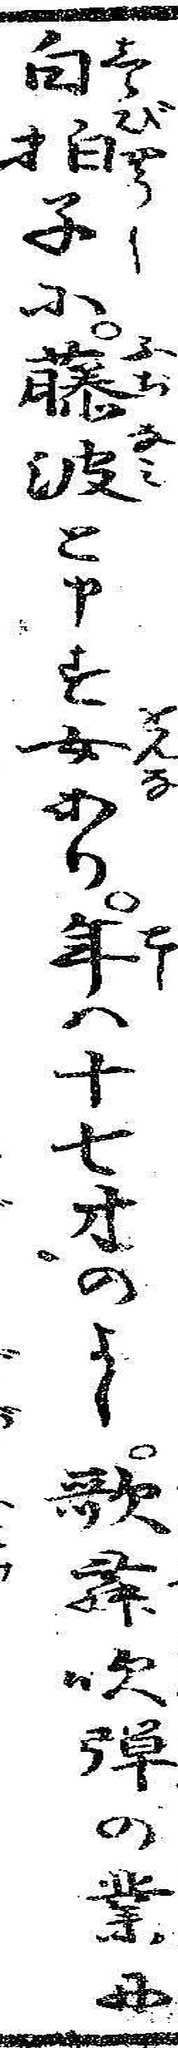白拍子に。藤波と申す女あり。年は十七才のよし。歌舞吹弾の業に
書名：昔話稲妻表紙
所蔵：国文学研究資料館
